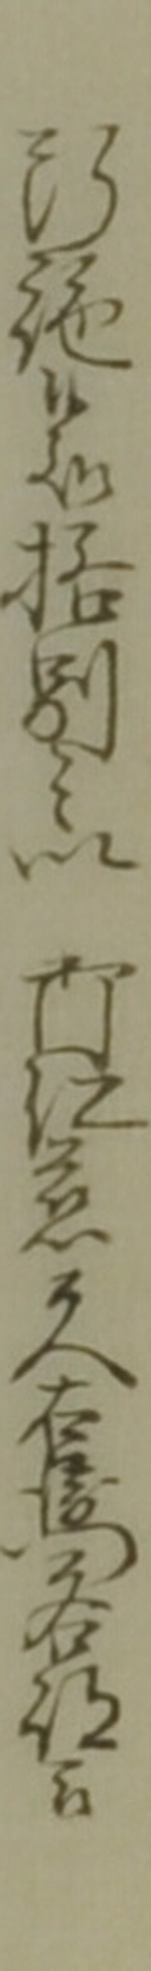断絶候処格別之以御仁慈久右衛門名跡被
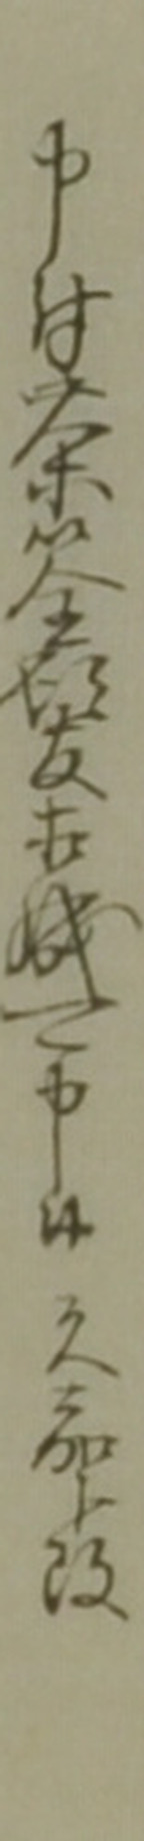申付茶筌髪相成可申候久嘉ト改
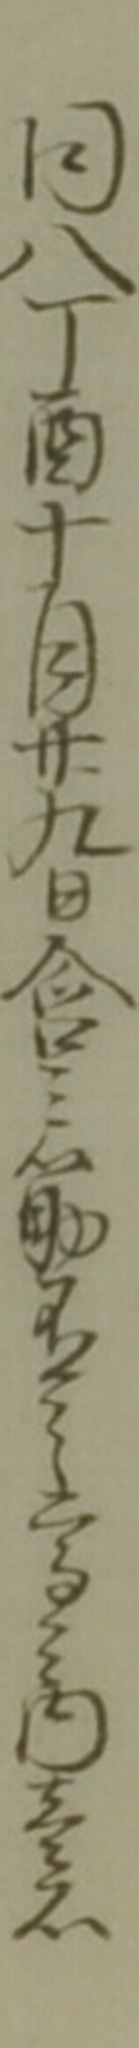一同八丁酉十月廿九日含之筋有之高之内壱石
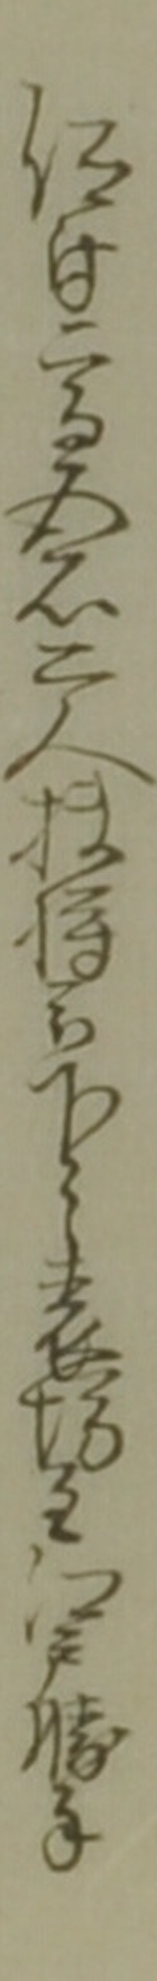仰付高五石二人扶持被下之表坊主江戸勝手
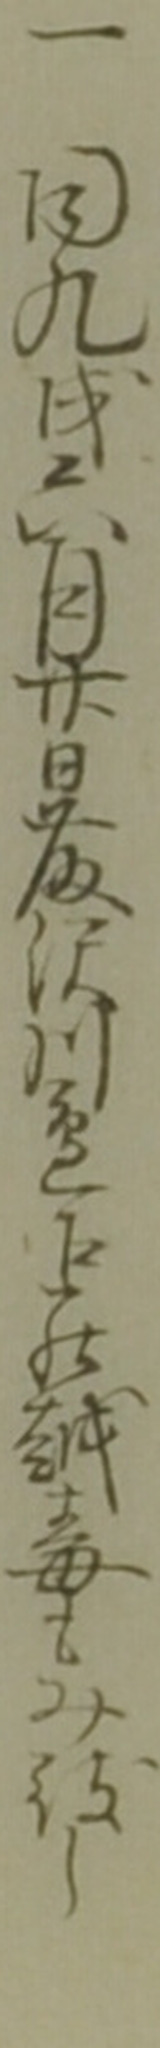一同九戌六月廿日藤沢川辺江罷越毒もみ致し
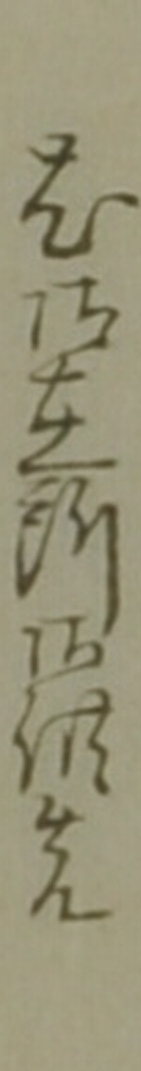尤御在所御供先
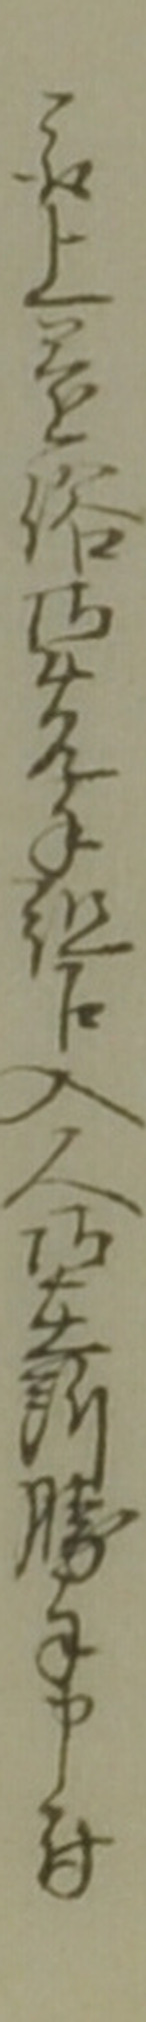取上還俗御先手組江入人御在所勝手申付
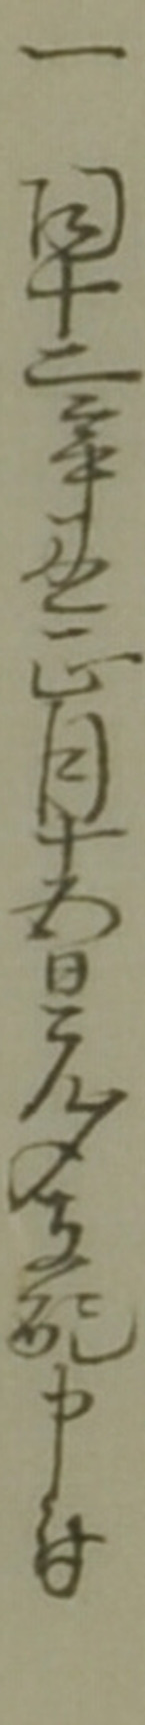一同十二辛丑正月十五日元〆支配申付
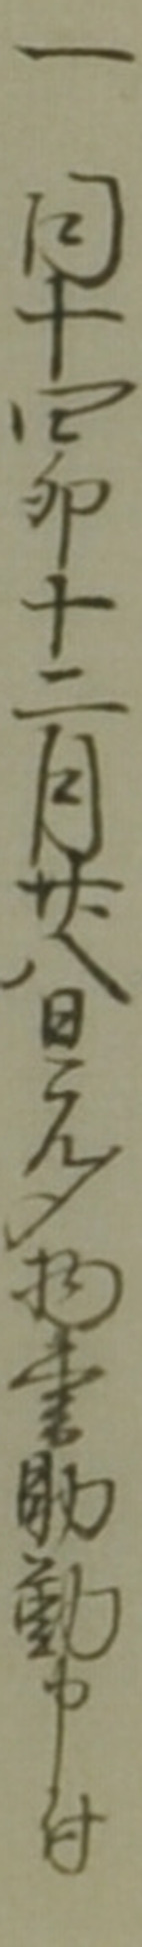一同十四卯十二月廿八日元〆物書助勤申付
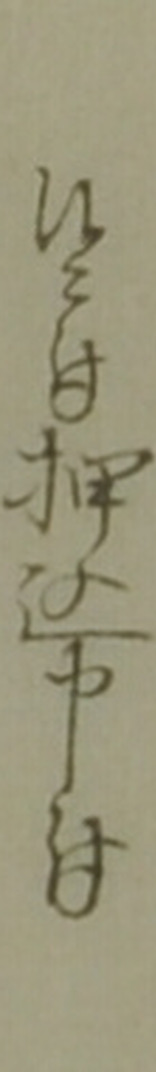候ニ付押込申付
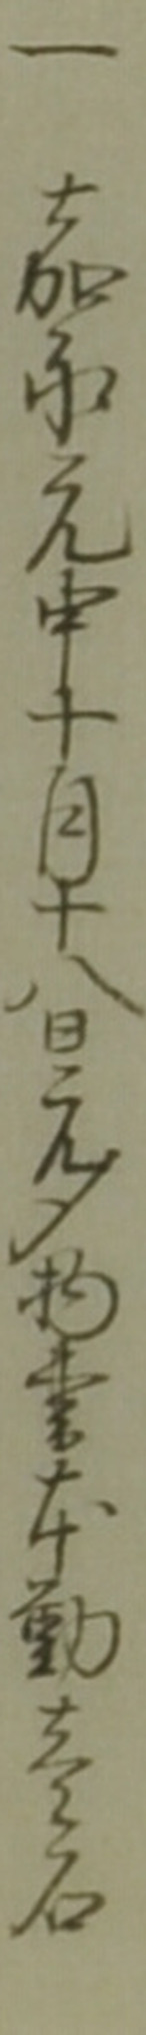一嘉永元申十月十八日元〆物書本勤壱石
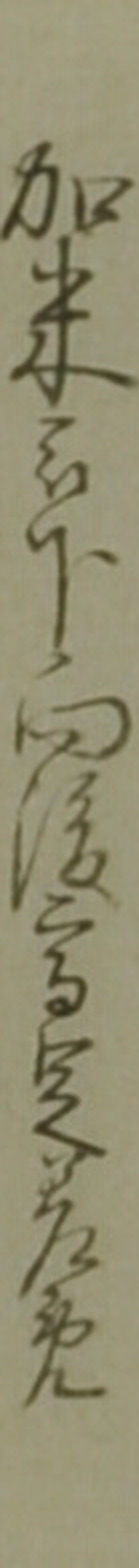加米被下向後高定差免

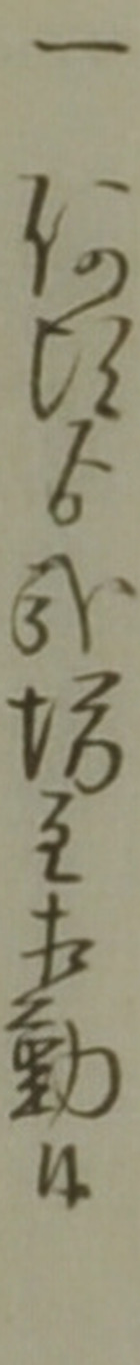一何頃ゟ哉坊主相勤候
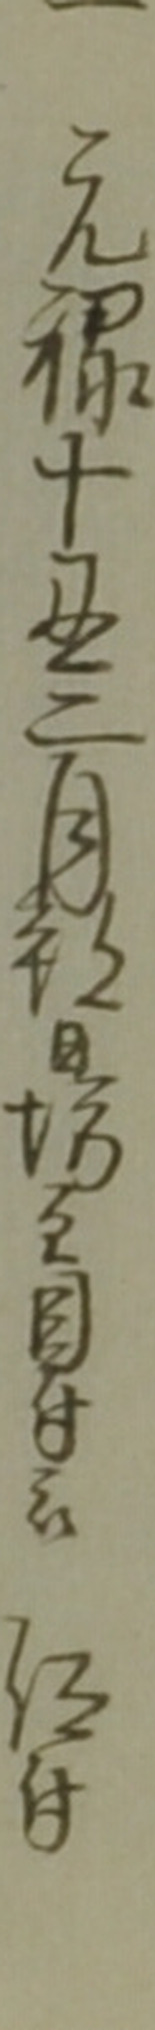一元禄十丑二月朔日坊主目付被仰付
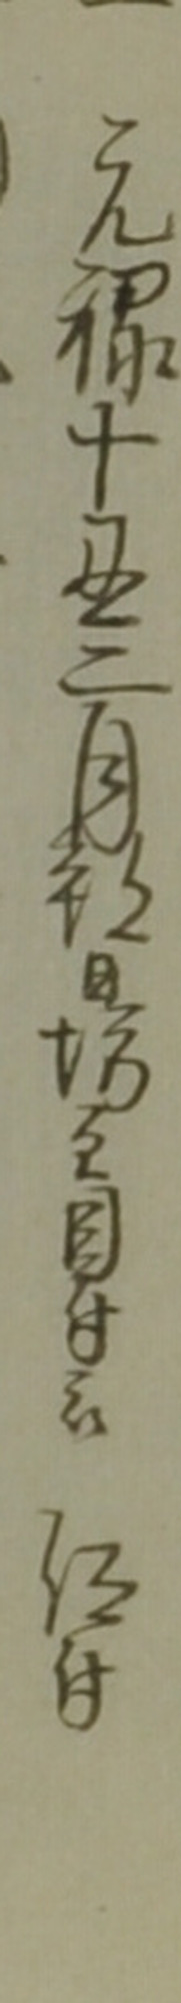一元禄十丑二月朔日坊主目付被仰付
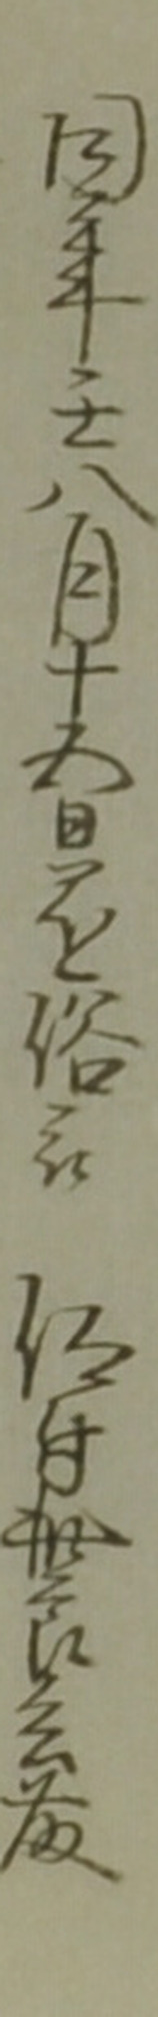一同年閏八月十五日還俗被仰付此節兵藤
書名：無足諸士勤仕録（九）
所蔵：伊那市立高遠町図書館・合同会社AMANE
